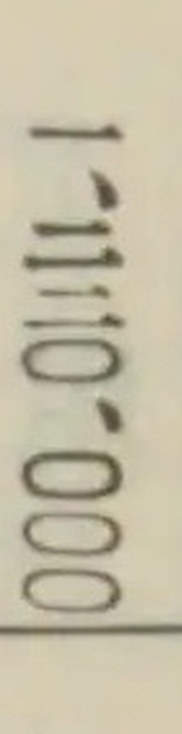計一、四六八、〇〇〇
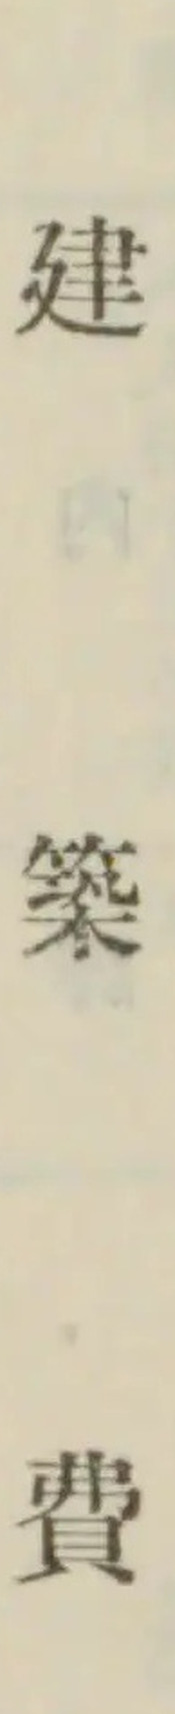建築費
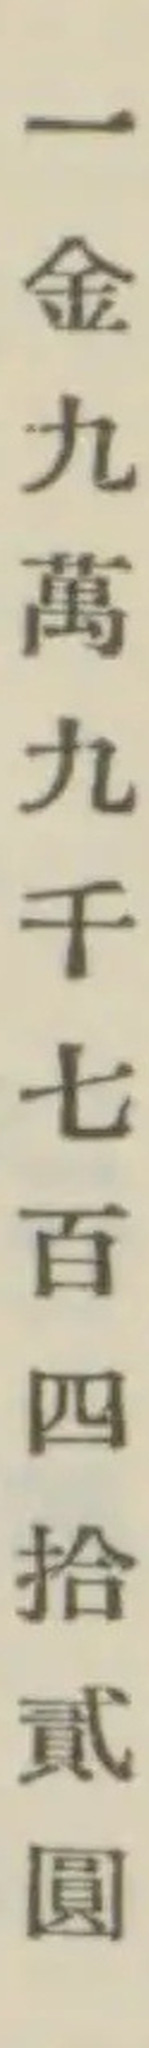一金九萬九千七百四拾貳圓
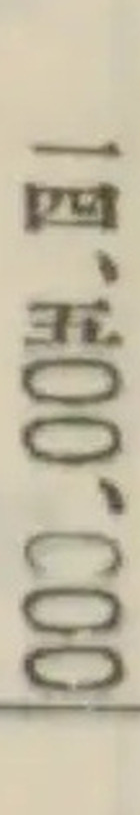雑費五〇〇、〇〇〇
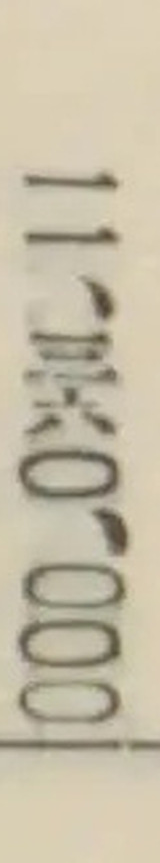計一、四六八、〇〇〇
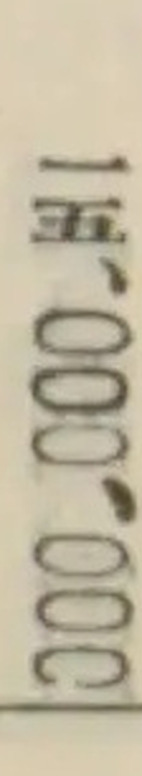計五七、八〇〇、〇〇〇

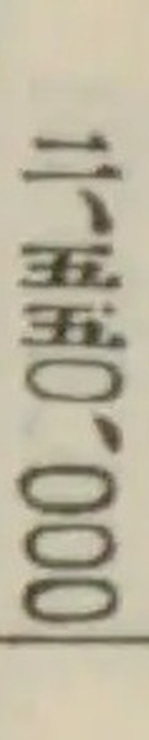雑工五〇〇、〇〇〇
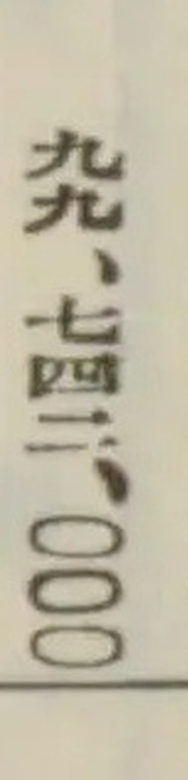計九九、七四二、〇〇〇
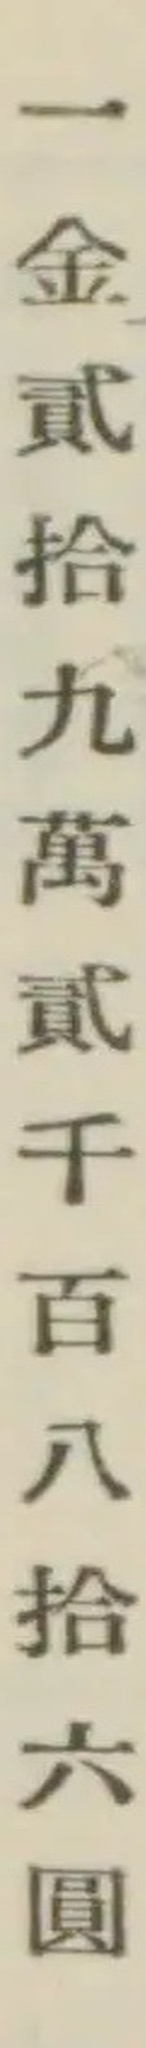一金貳拾九萬貳千百八拾六圓
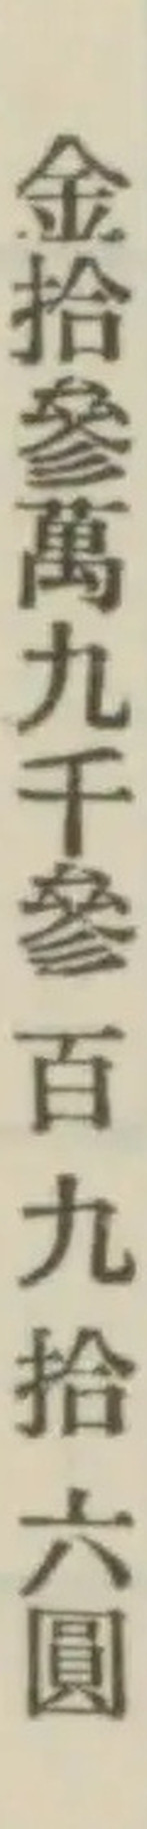一金拾參萬九千參百九拾六圓
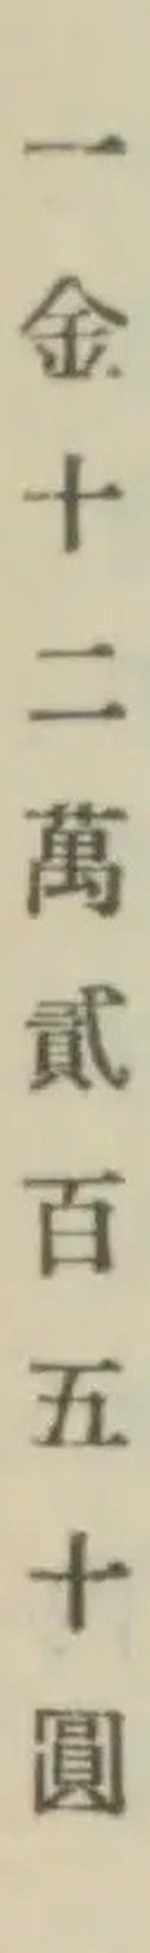一金十二萬貳百五十圓
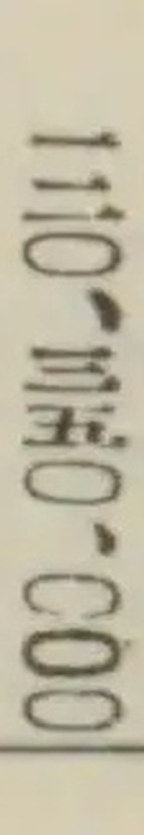計一二〇、三五〇、〇〇〇
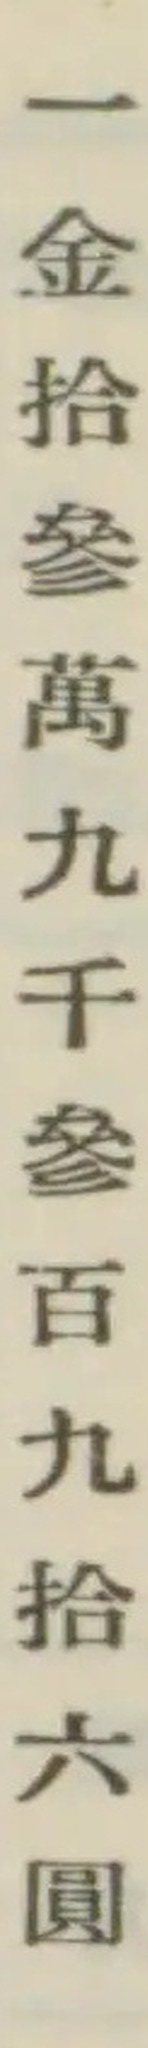一金拾參萬九千參百九拾六圓
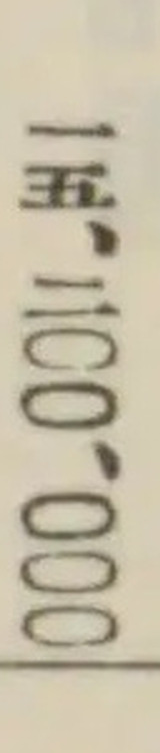雑工五〇〇、〇〇〇
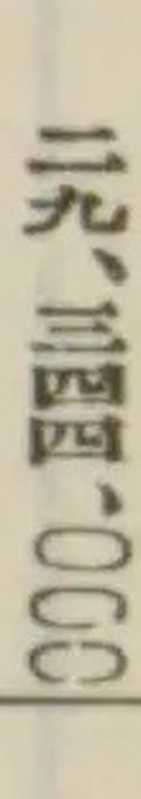計九九、七四二、〇〇〇
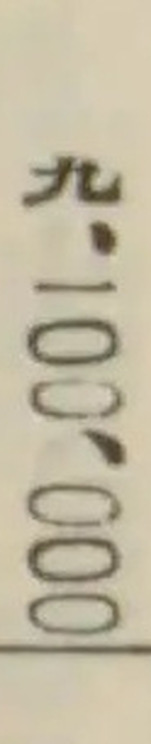雑工五〇〇、〇〇〇
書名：豊橋市水道誌
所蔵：国立国会図書館 National Diet Library, JAPAN
